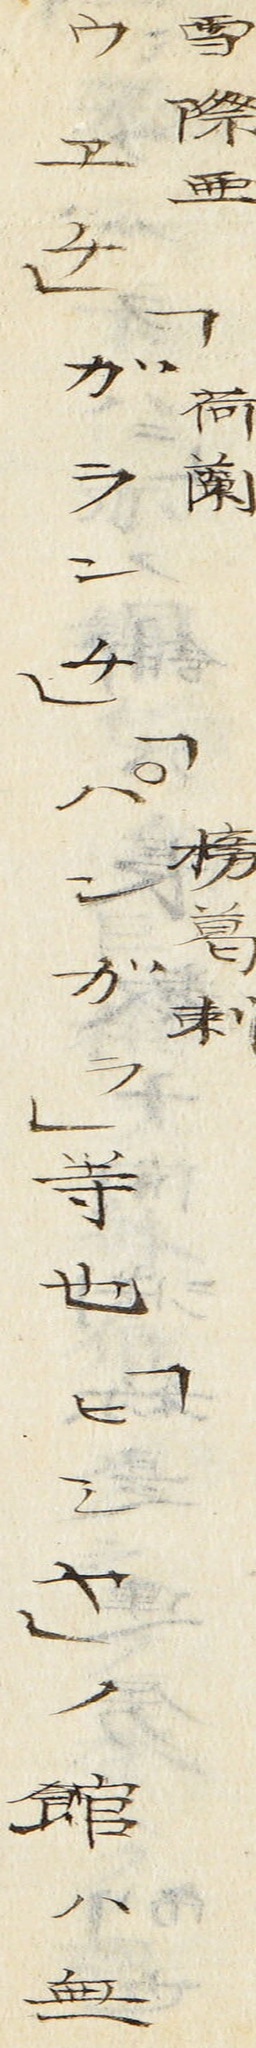ウヱチ」「ガランチ」「パンガラ」等也「ヒシヤ」ノ館ハ無
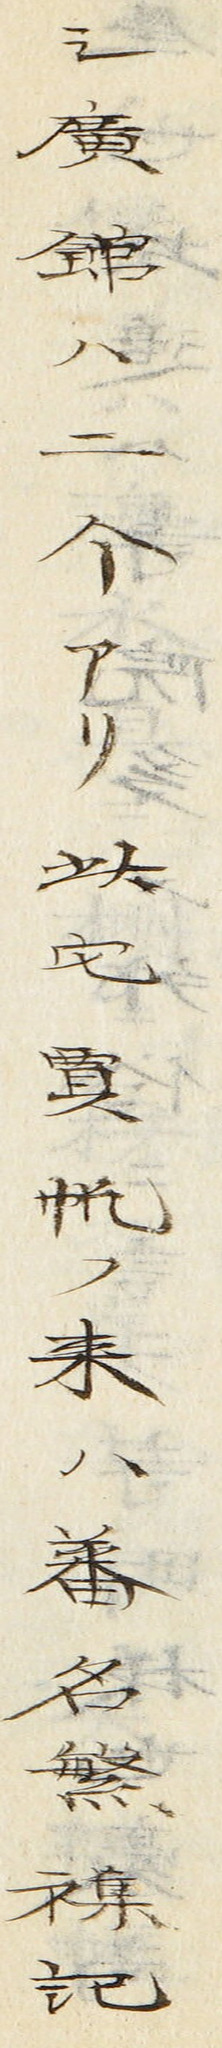シ廣館ハ二个アリ此宅賈帆フ来ハ蕃名繁襍記
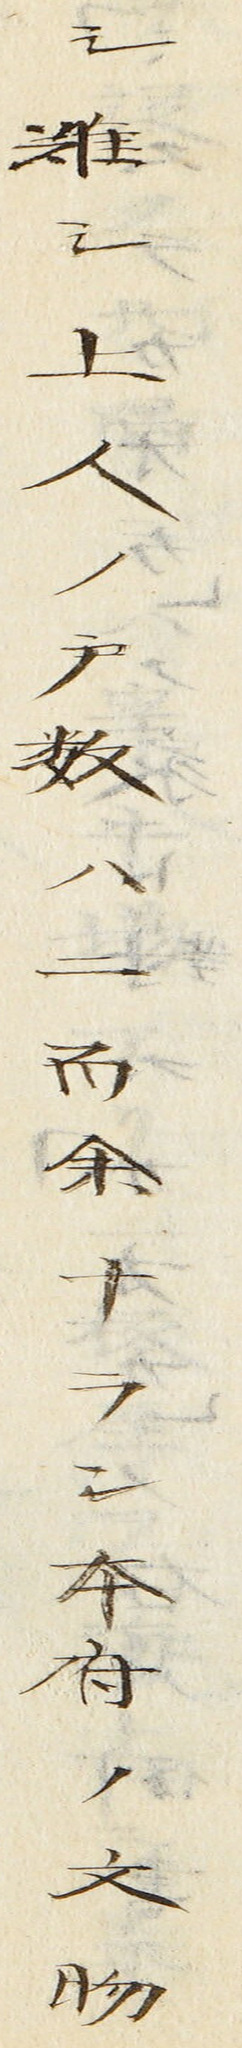シ難シ上人ノ戸数ハ二百余十ナラン本府ノ文昒
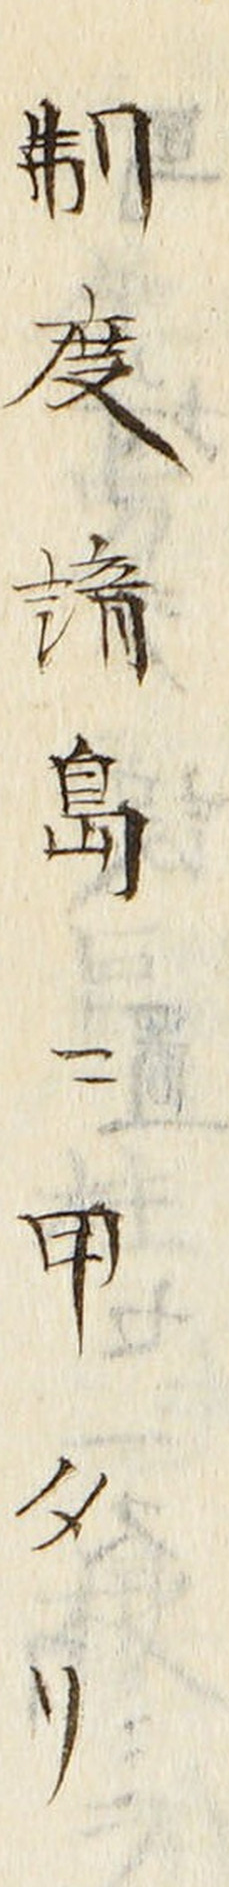制度諸島二甲タリ
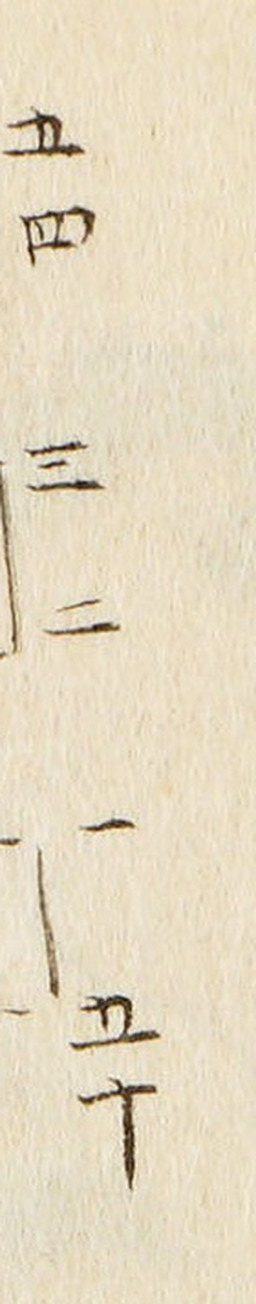五四三二一五十
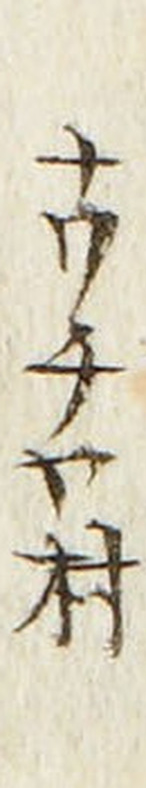ナワチヤ村
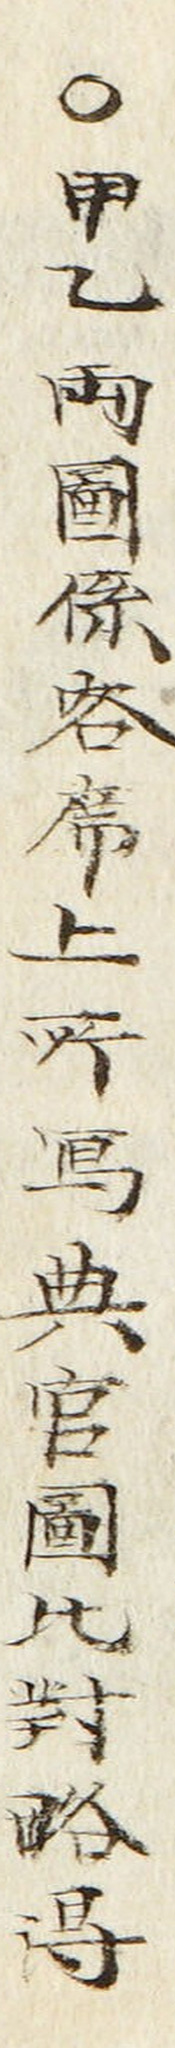〇甲乙両国係客席上所寫典官圖比對
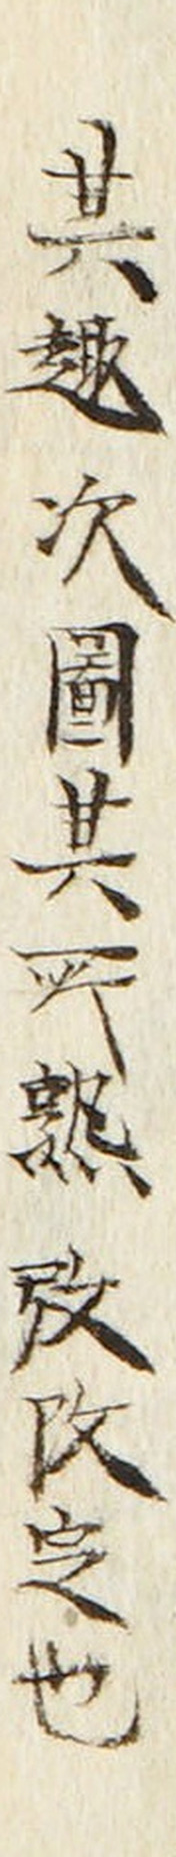其趣次圖其所熟攷改完也

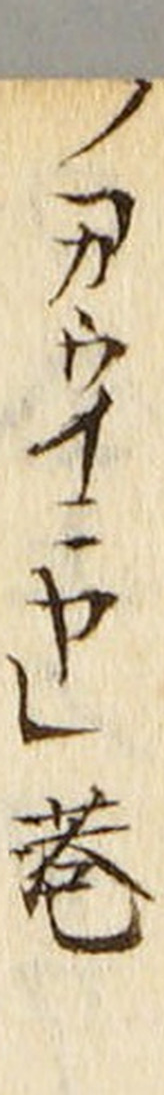ノ「カウイニヤ」港

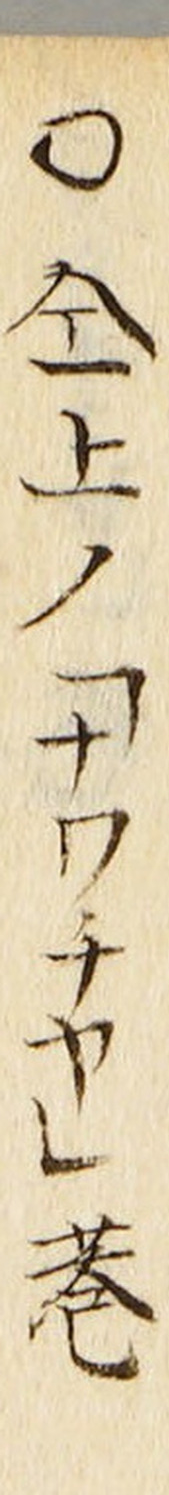〇仝上ノ「ナワチヤ」港

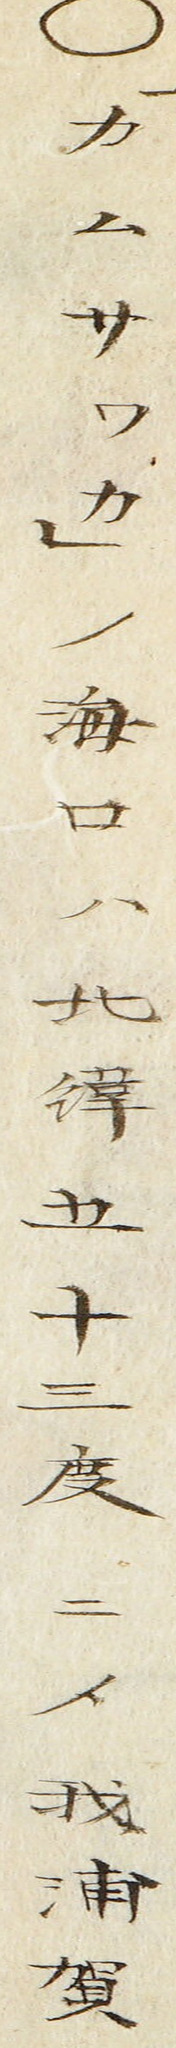〇「カムサツカ」ノ海口ハ北緯五十三度ニシテ我浦賀
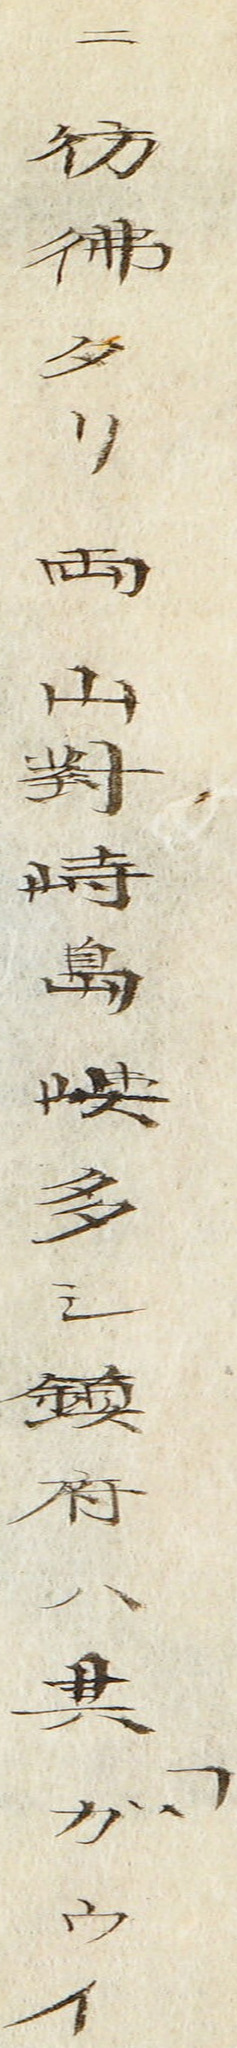ニ彷彿タリ両山對峙島嶼多シ鎮府ハ其「ガウイ
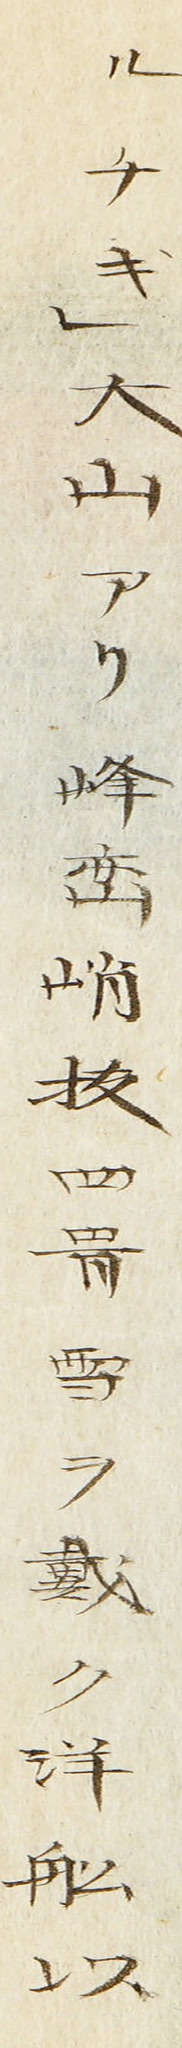ルチギ」大山アリ峰峦峭抜四雪ヲ戴ク洋舩以
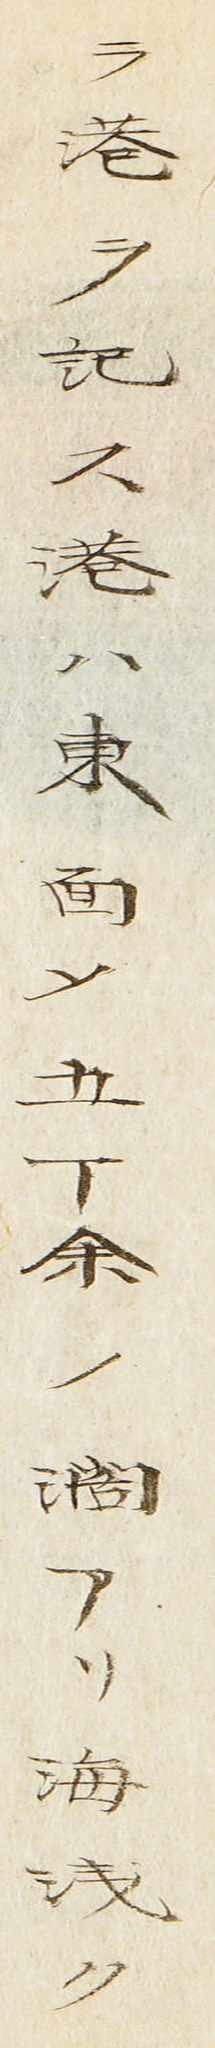ラ港ヲ記ス港ハ東面シテ五丁余ノ濶アリ海浅ク
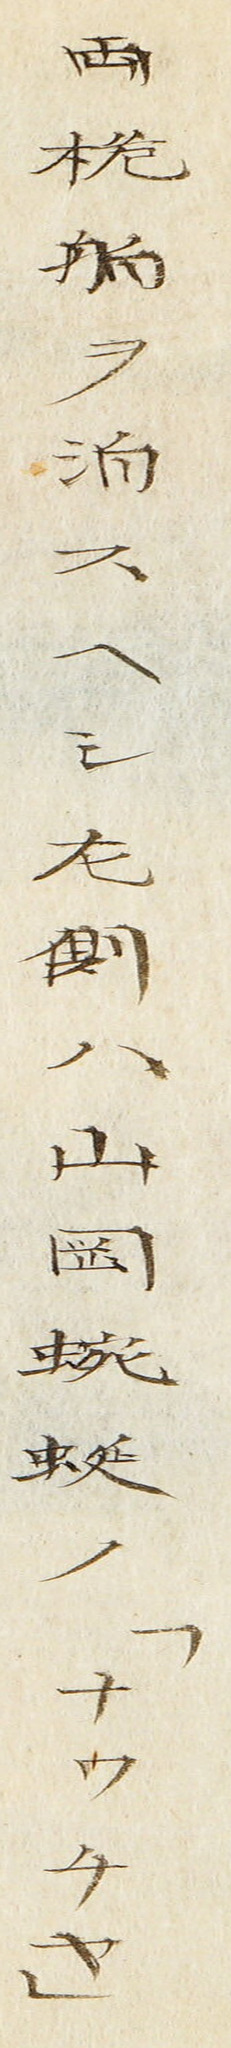両桅舶ヲ泊スヘシ左側ハ山岡蜿蜒ノ「ナウチヤ」
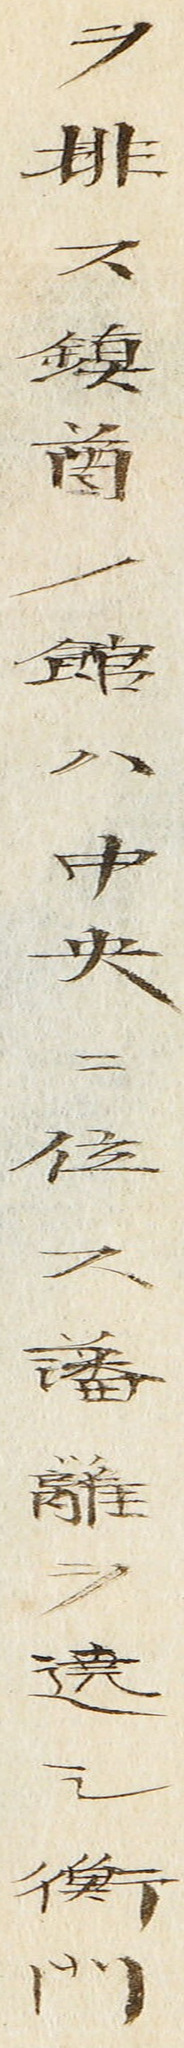ヲ排ス鎮酋ノ館ハ中央ニ位ス藩籬ヲ遶シ衡門
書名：蕃談
